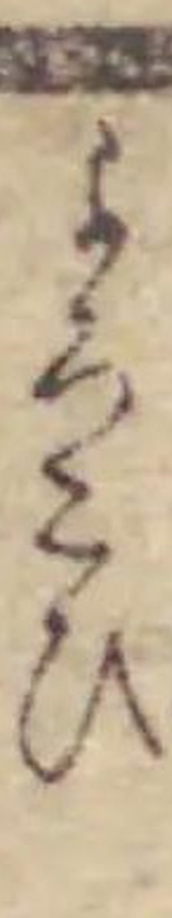よろこひ
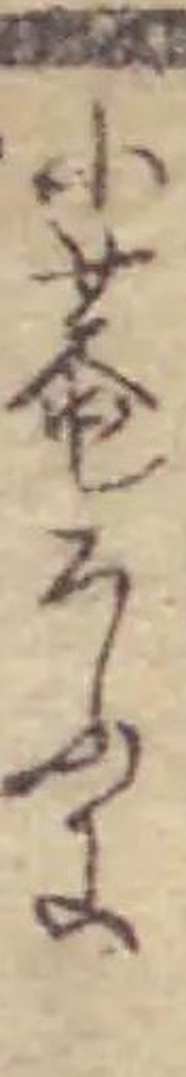小菴くふに
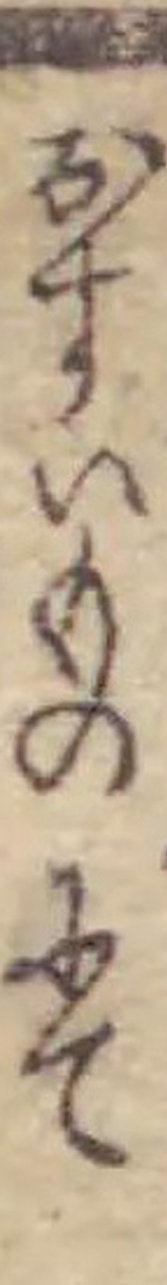おすいものにて
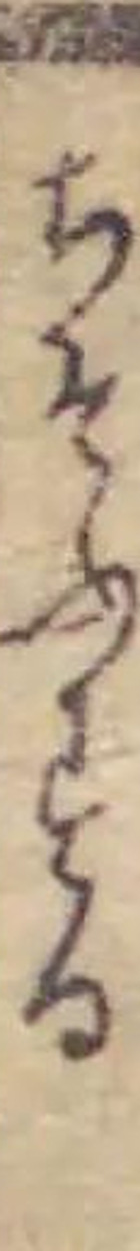ちそふする

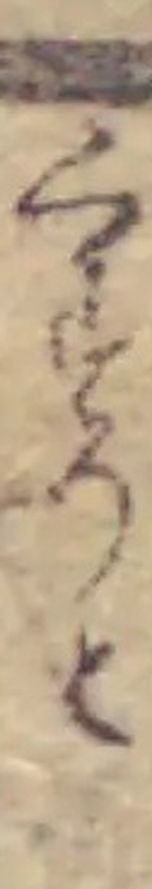くすりと
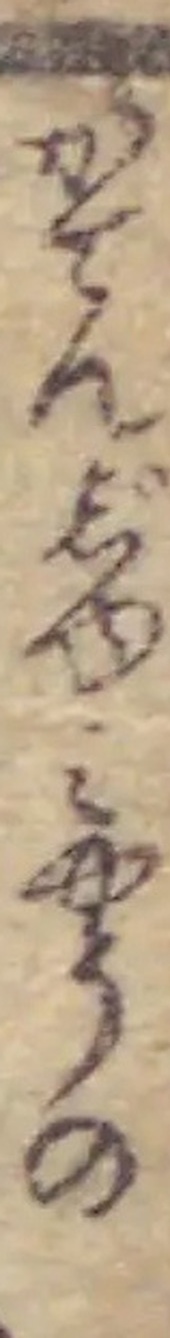かてんじゆみやうの
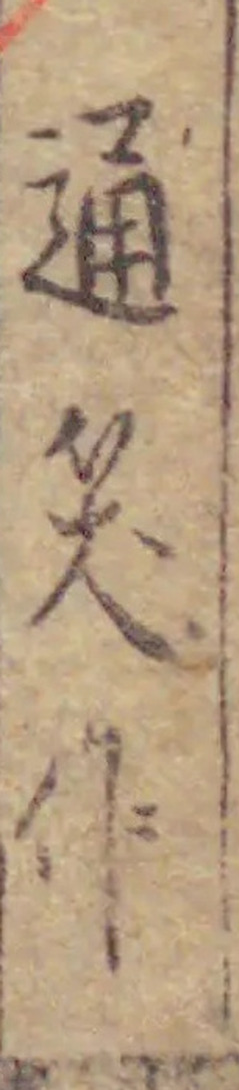通笑作
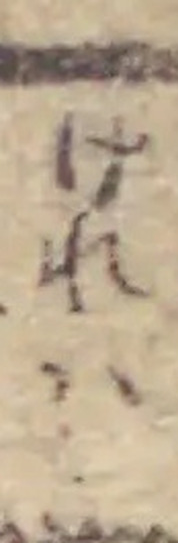けれは
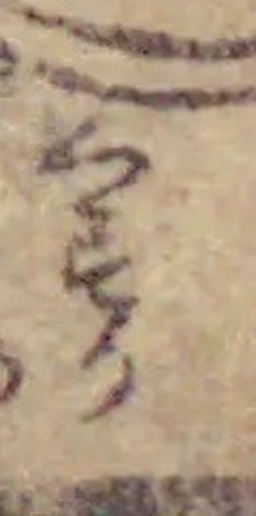くすり
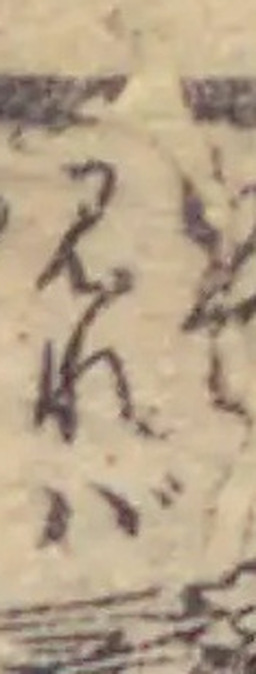みれば
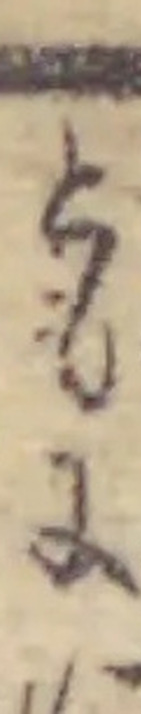ともに
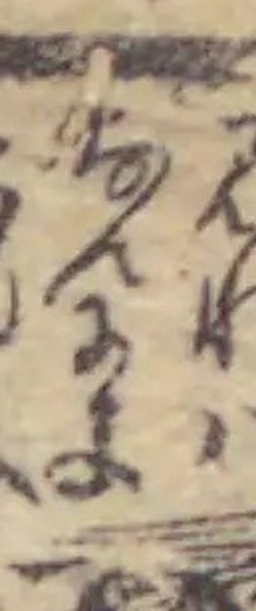なんによ
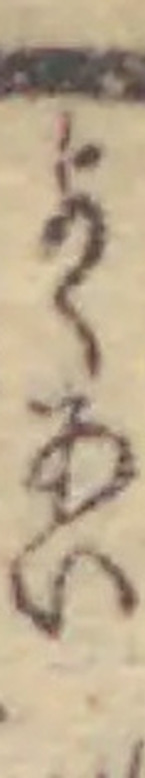よくあい
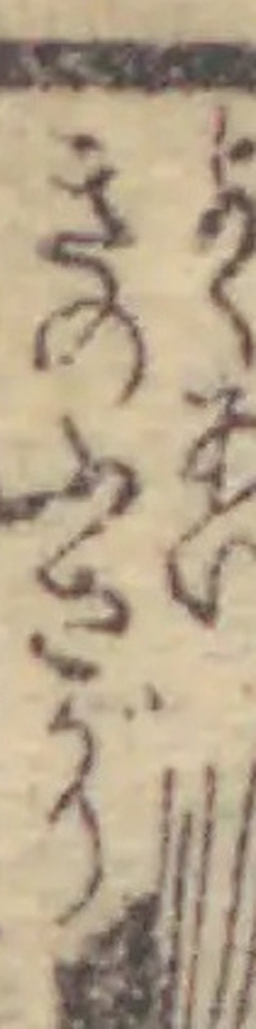きのふさがり
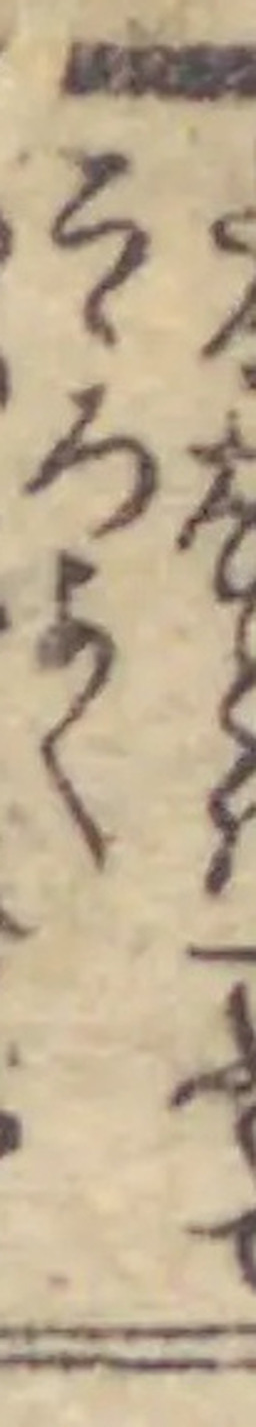こゝろよく
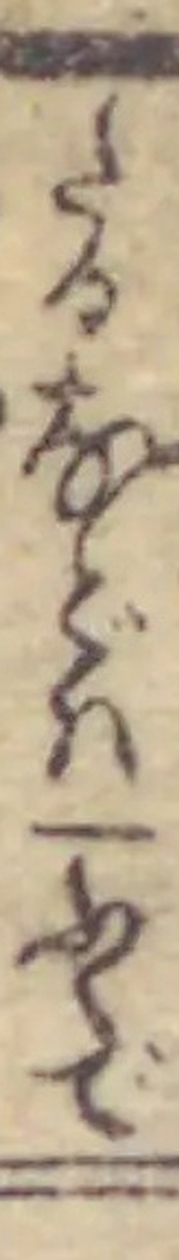たるなどは一ふくで
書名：家伝寿命薬 2巻
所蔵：国立国会図書館 National Diet Library, JAPAN
